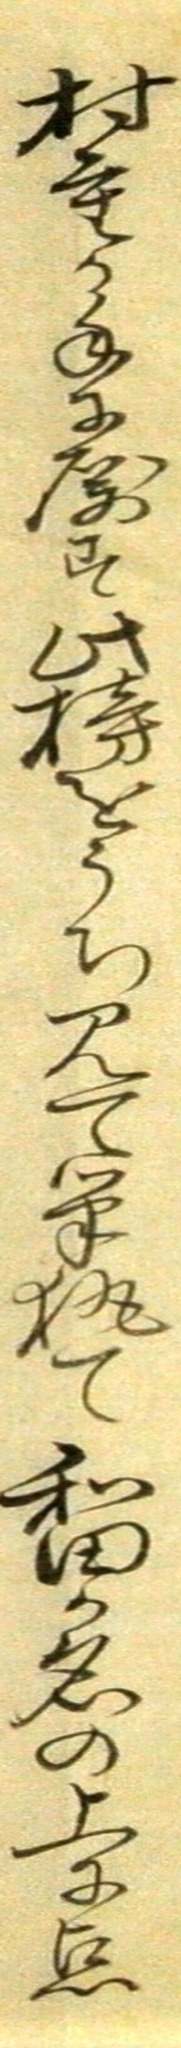村重か手に属す此榜をうち見て筆執て和田か名の上に点
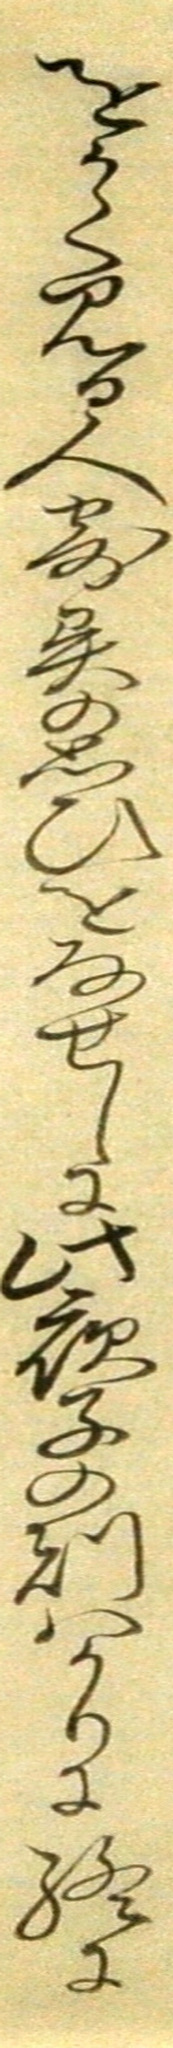をかく見る人奇異の思ひをなせしに此夜子の刻はかりに終に
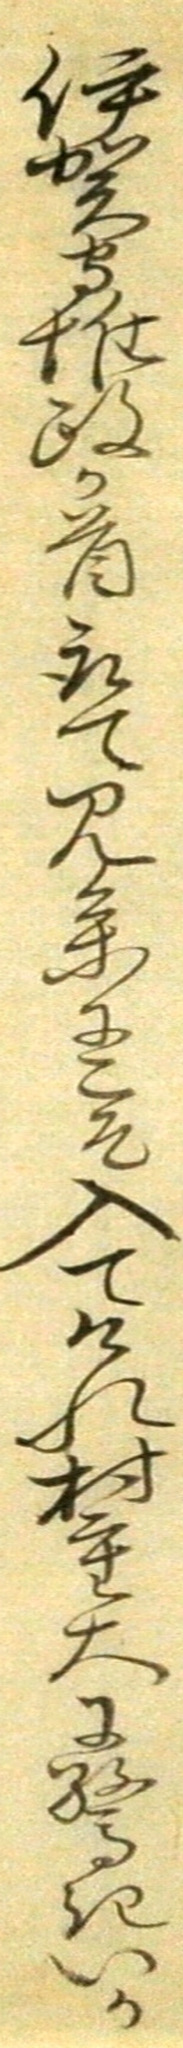伊賀守惟政か首取て見参にこそ入てけれ村重大に驚きいか
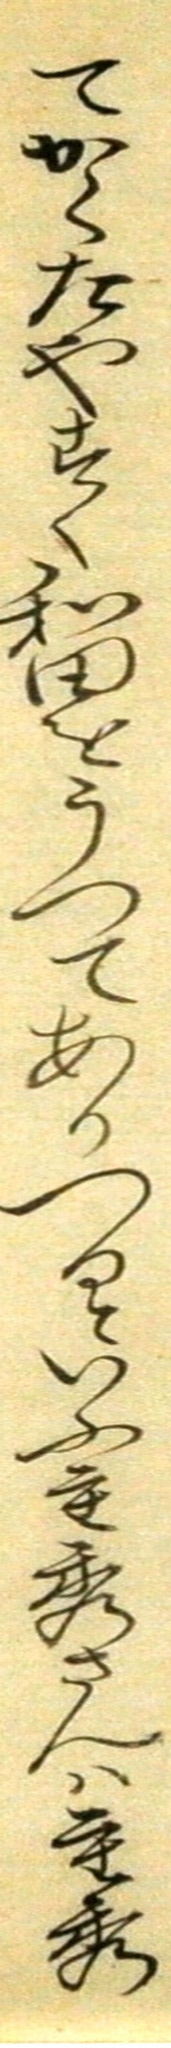てかくたやすく和田をうつてありつるといふ重秀さんは重秀
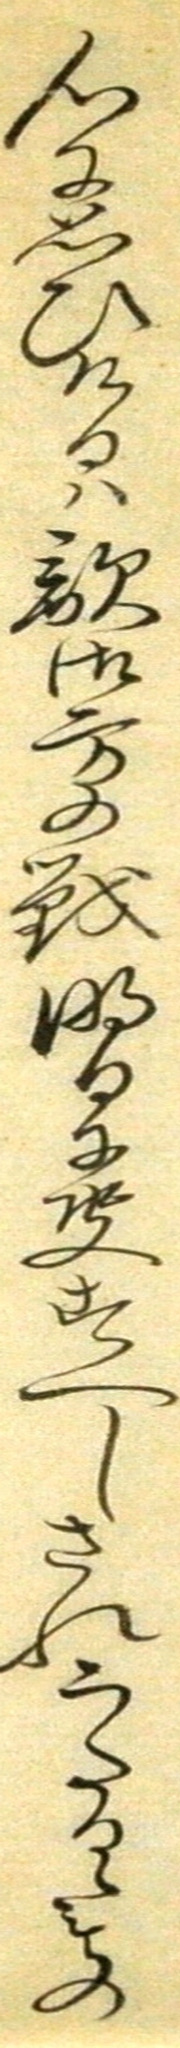心に思ひけるは敵御方の戦明日に決すへしされうたるゝもの
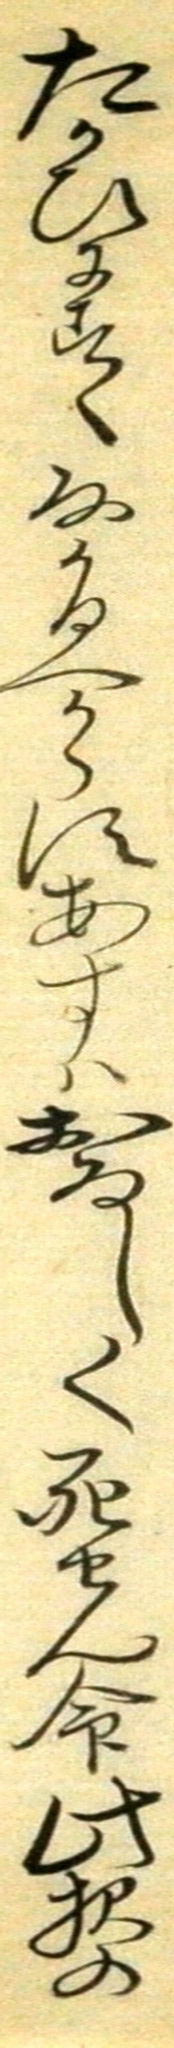たかひにすくなかるへからすあすはおなしく死せん命此夜の
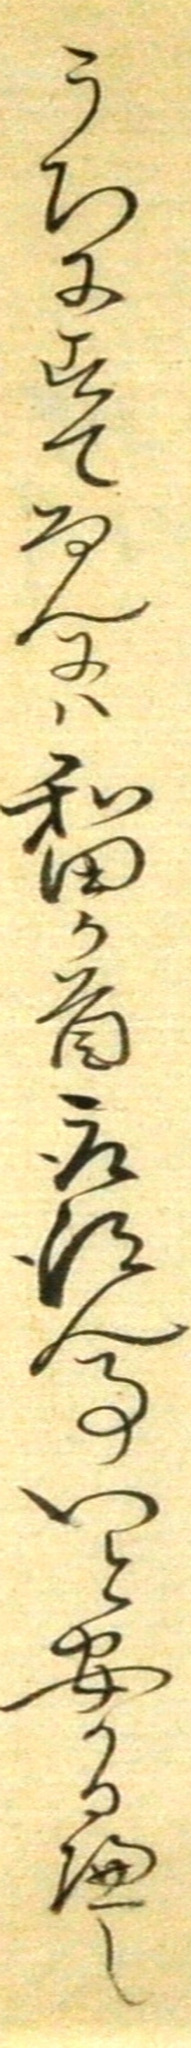うちにすてなんには和田か首取得ん事いと安かるへし
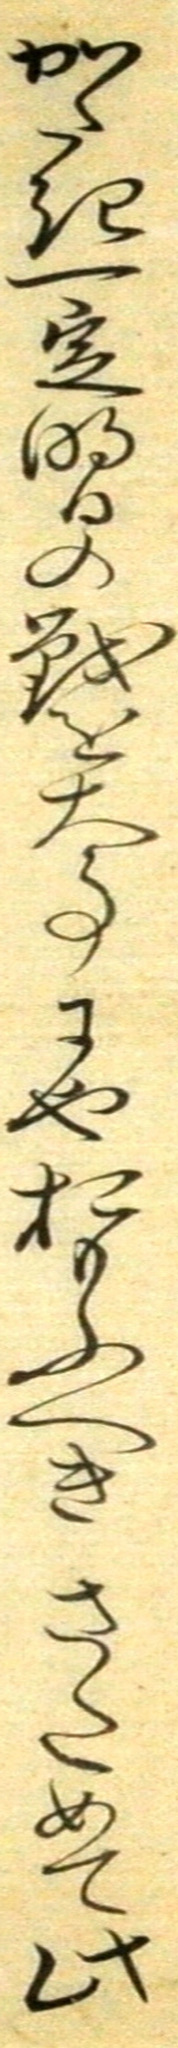かたき一定明日の戦を大事にやおもふへきさためて此
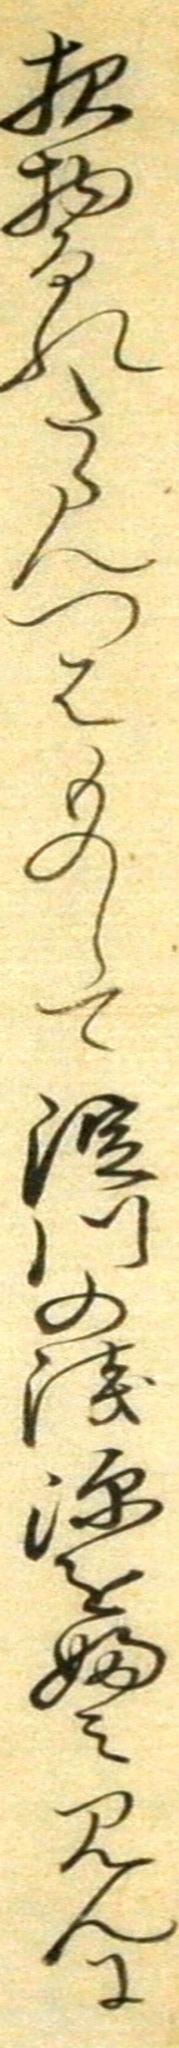夜物なれたらんつはものして淀川の浅深をふみ見んに
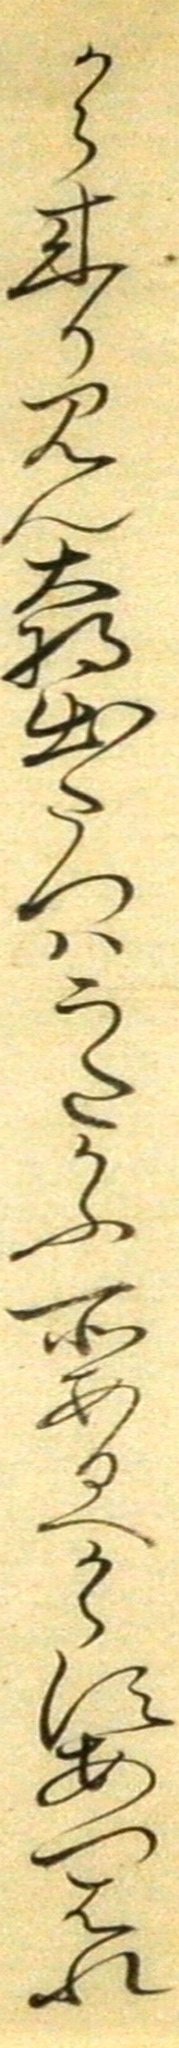から来り見ん大将出たつはうたかふ所あるへからすあつはれ
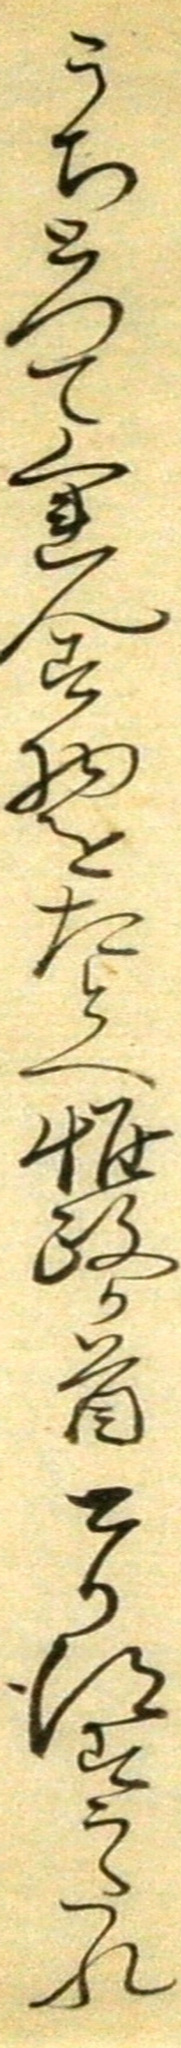うちとつてくれんす物をたとへ惟政か首とり得すうたれ
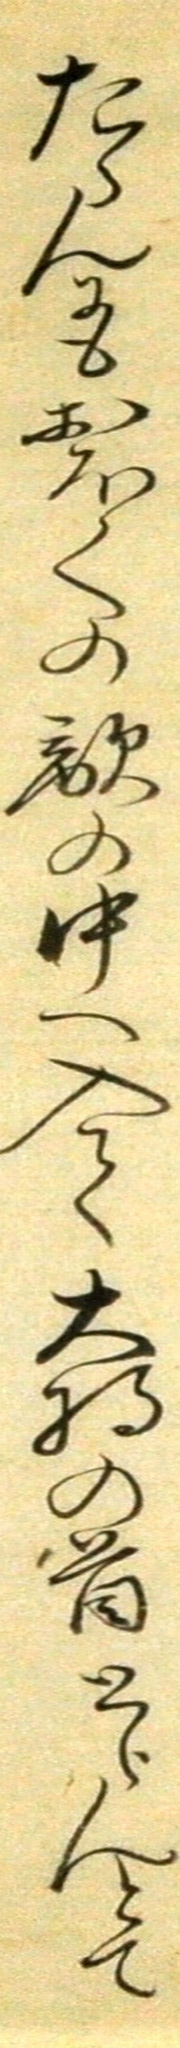たらんにもおほくの敵の中へ入て大将の首とらんとて
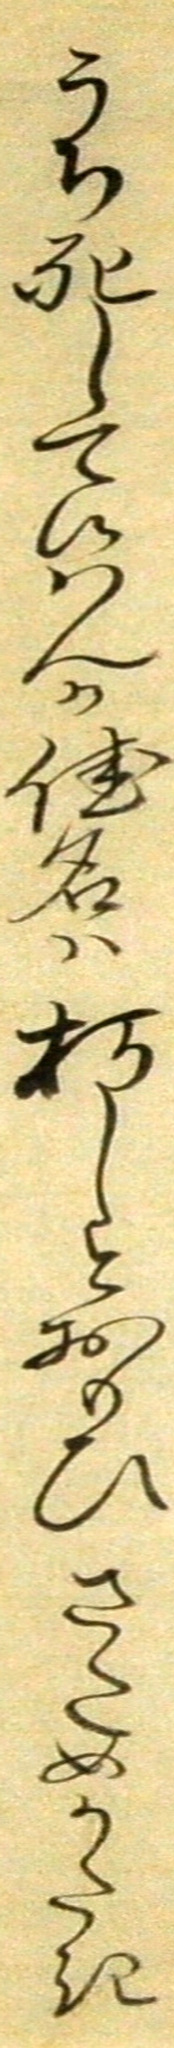うち死して候はんか佳名は朽しとおもひさためかたき
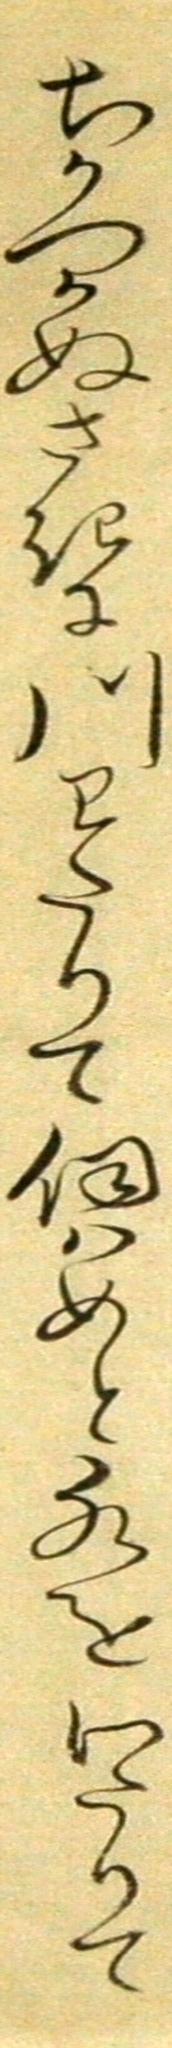ちかつかぬさきに川わたりて伺はめと水をわたりて
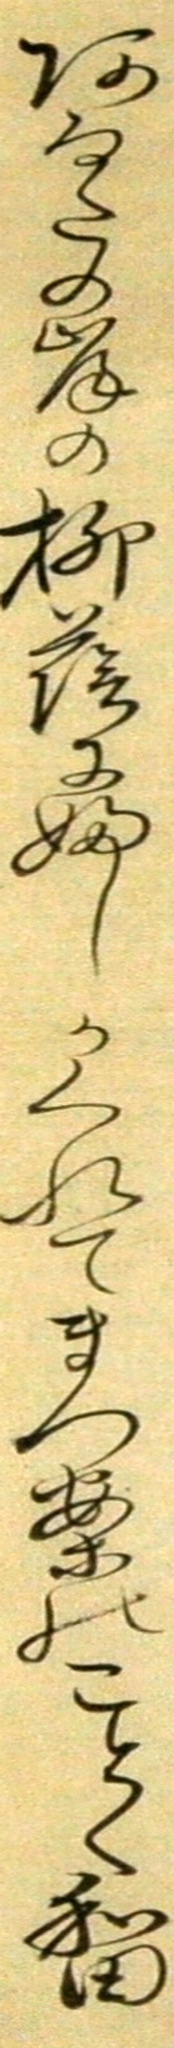あなたの岸の柳蔭にふしかくれてまつ案のことく和田
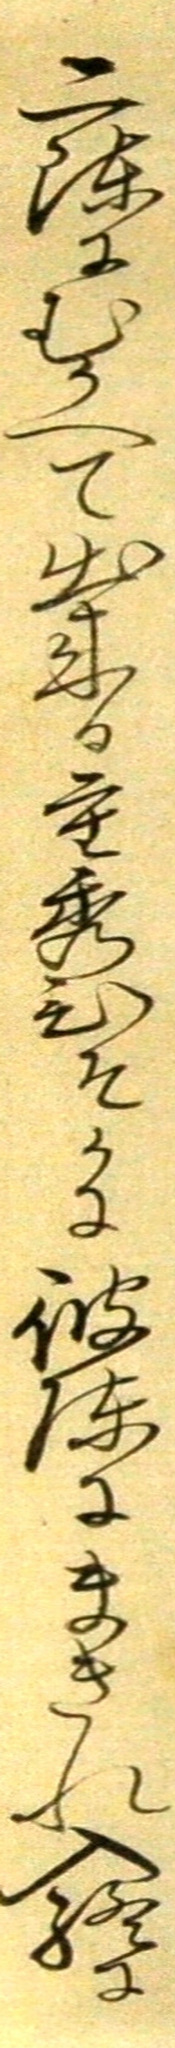二陣にむかへて出来る重秀ひそかに彼陣にまきれ入終に
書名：藩翰譜（九・下）
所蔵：伊那市立高遠町図書館・合同会社AMANE
